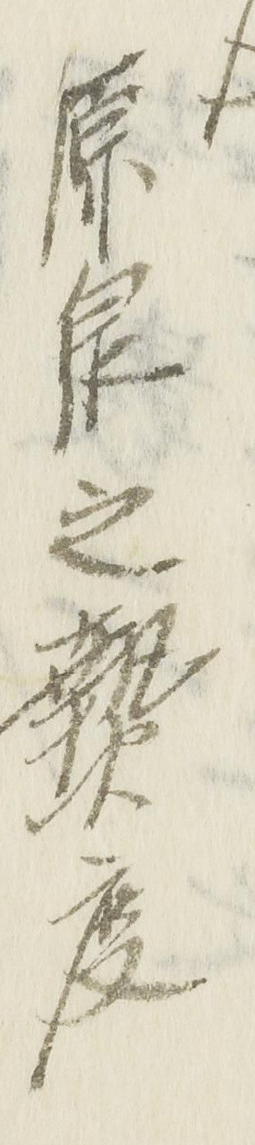原泉之熱度
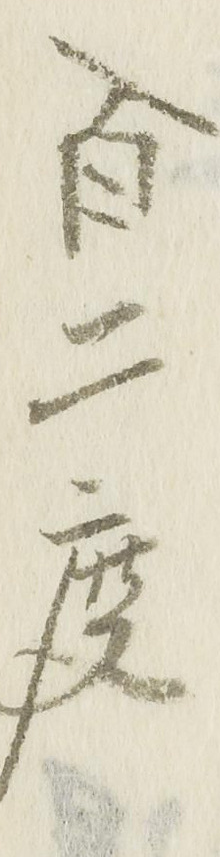百二度

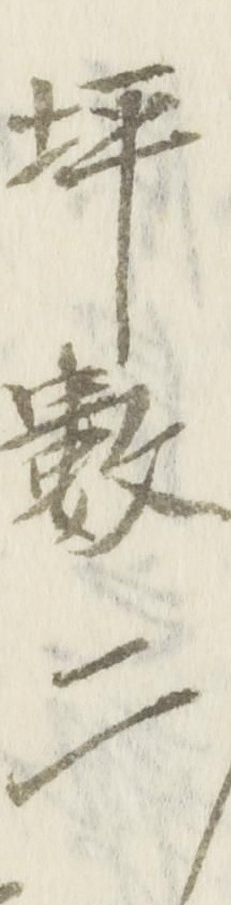坪数二
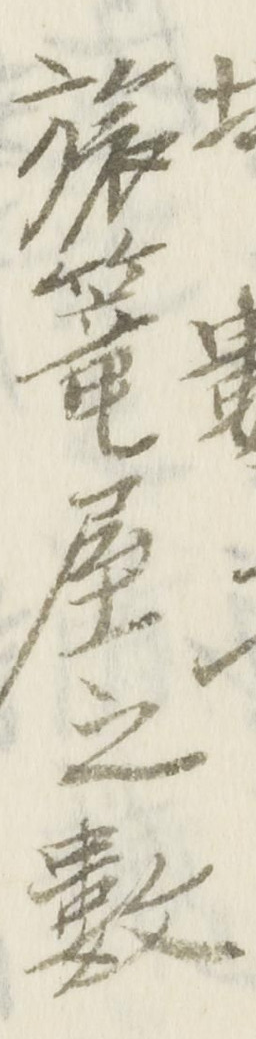旅籠屋之数
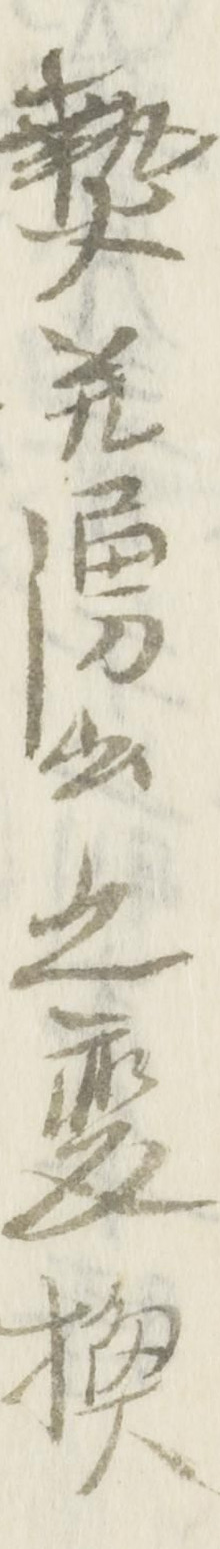熱并湧出之変換
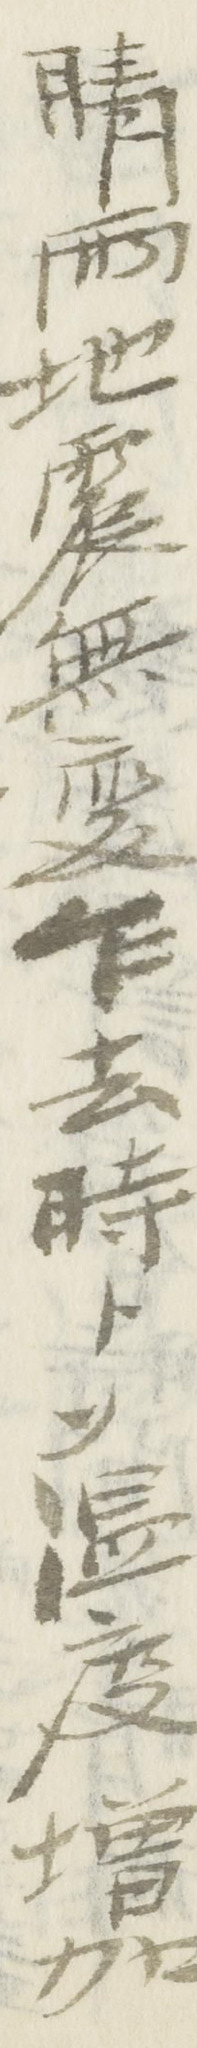晴雨地震無変乍去時トノ温度増加
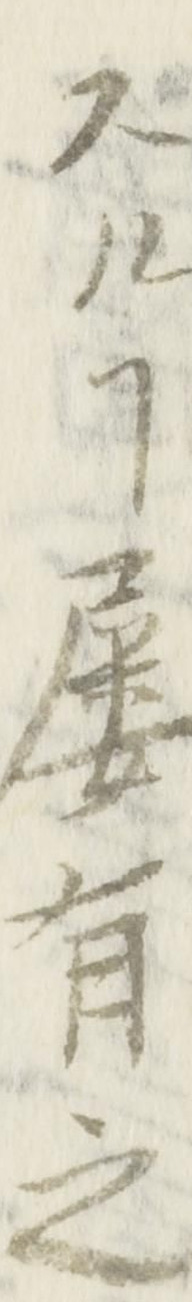スルニ屡有之
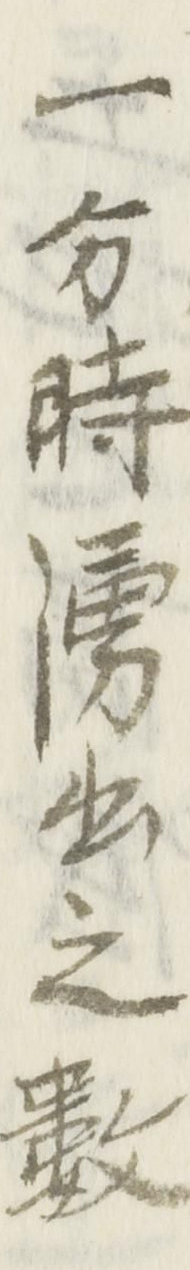一分時湧出之数
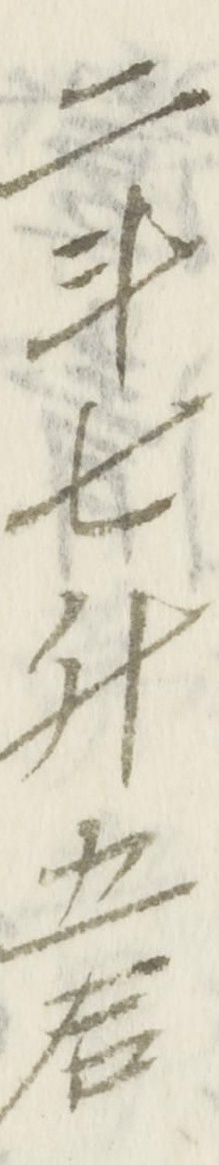二斗七升五合
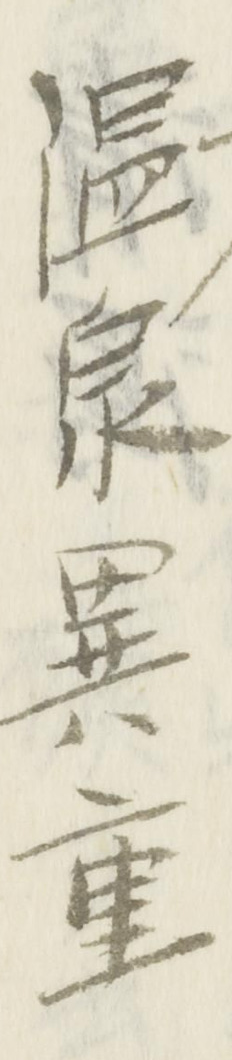温泉異重
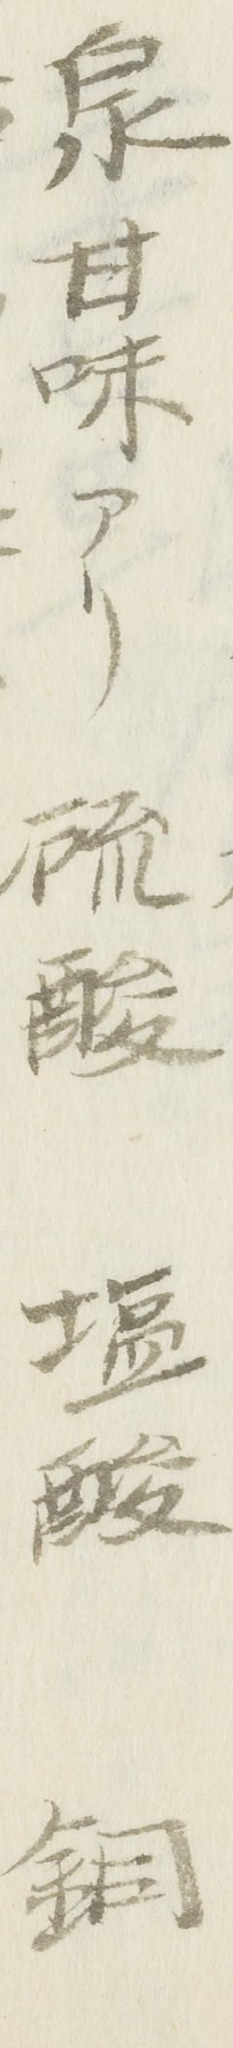泉甘味アリ硫酸塩酸銅
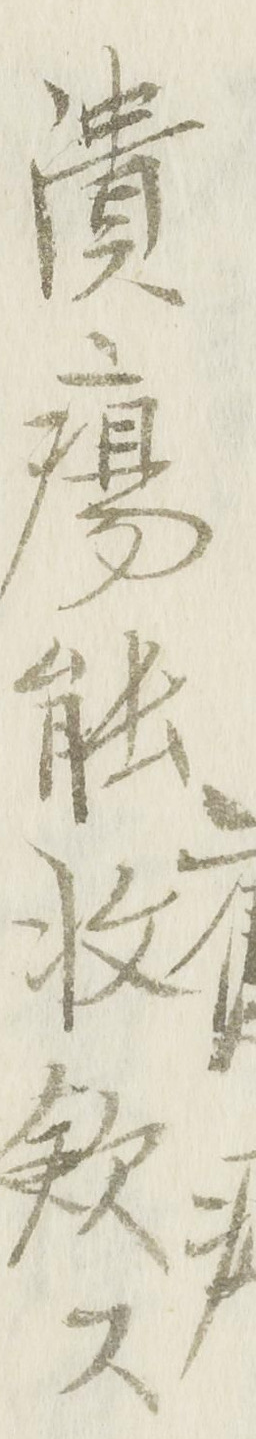潰瘍能収斂ス

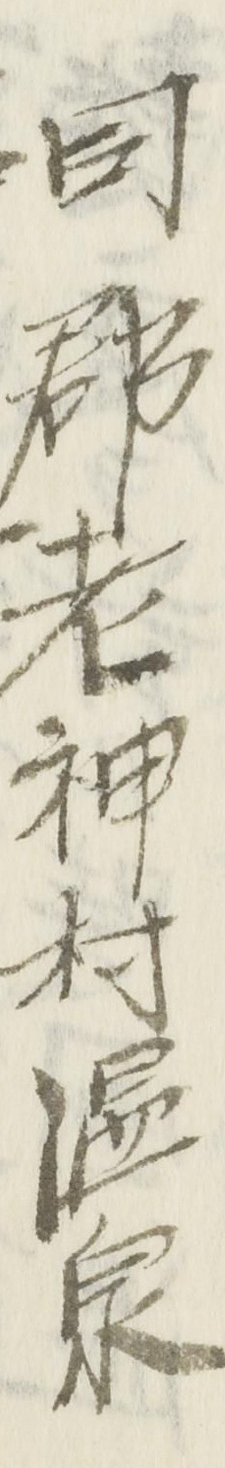同郡老神村温泉
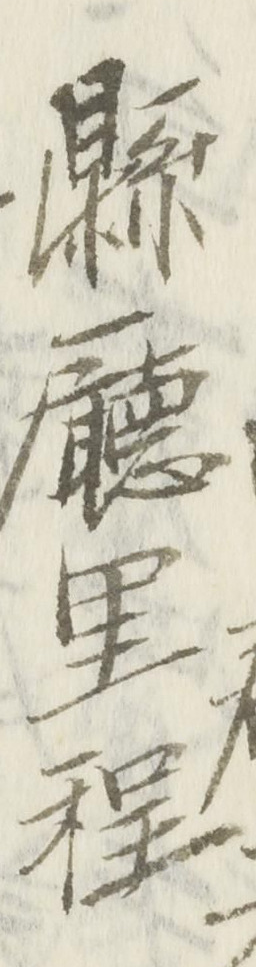県庁里程
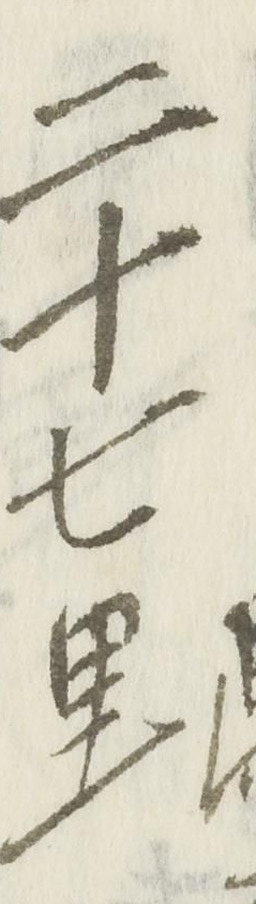二十七里
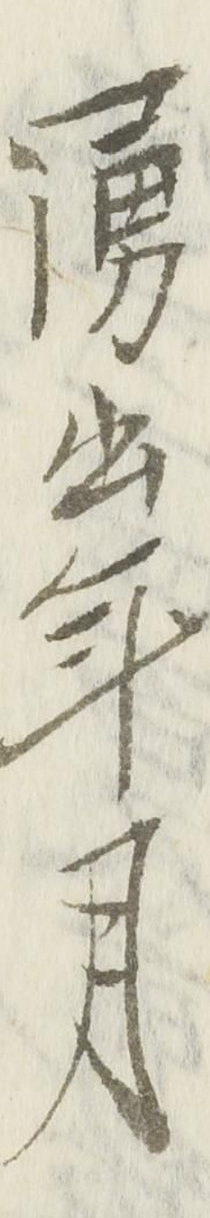湧出年月
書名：温冷泉試験表
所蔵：東京大学地震研究所図書室 Earthquake Research Institute Library, The University of Tokyo, JAPAN
